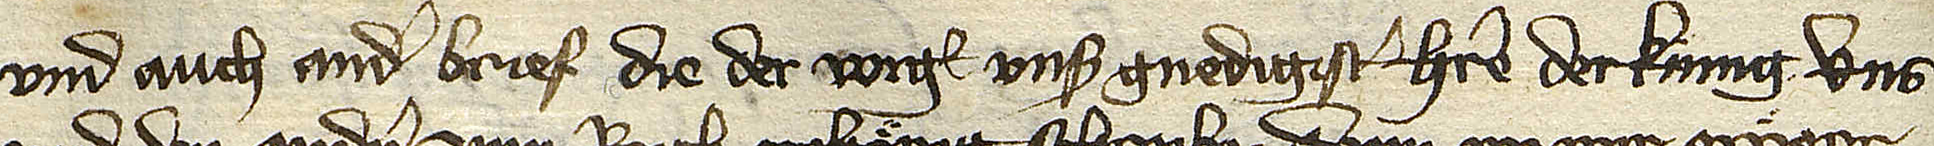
vnd auch and* brief die der vorg* vnſ* gnedigiſt* hre* der künig Vns
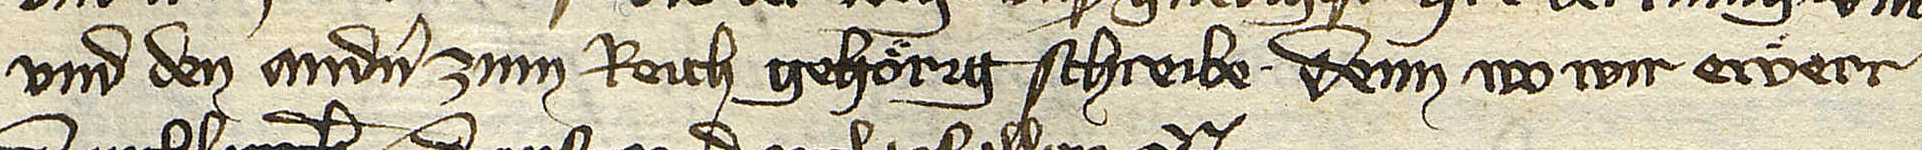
vnd den andn* ʒum Reich gehörig ſchreibe . Denn wo wir ewerr
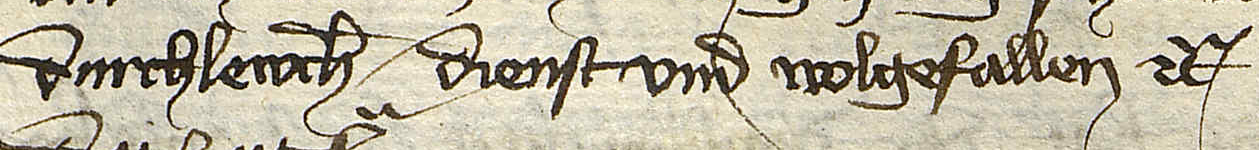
durchlewch* dienſt vnd wolgefallen ec*
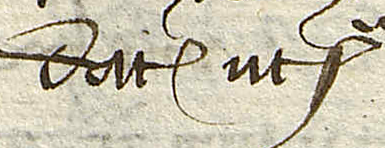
dat* ut ſ*
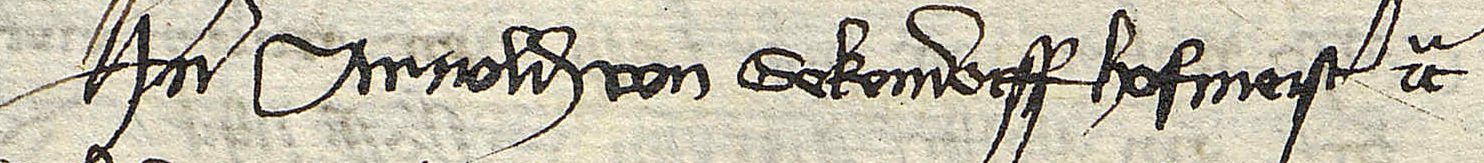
Hr* Arnold* von Sekendorff hofmeiſt* ec*
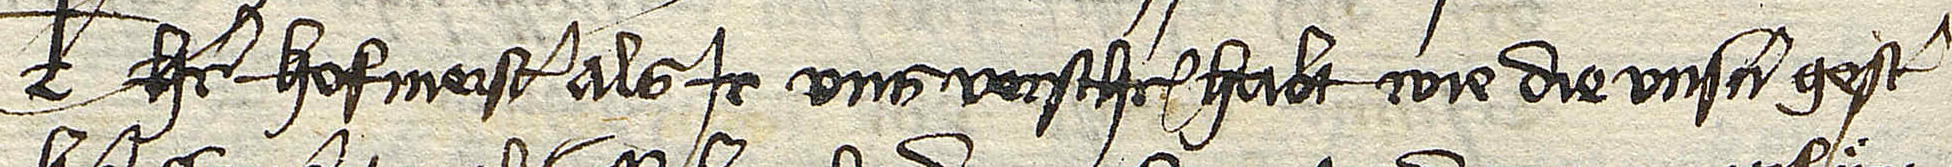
L* hr* hofmeiſt* als Ir vns verſchr* habt wie die vnſn* geſt*
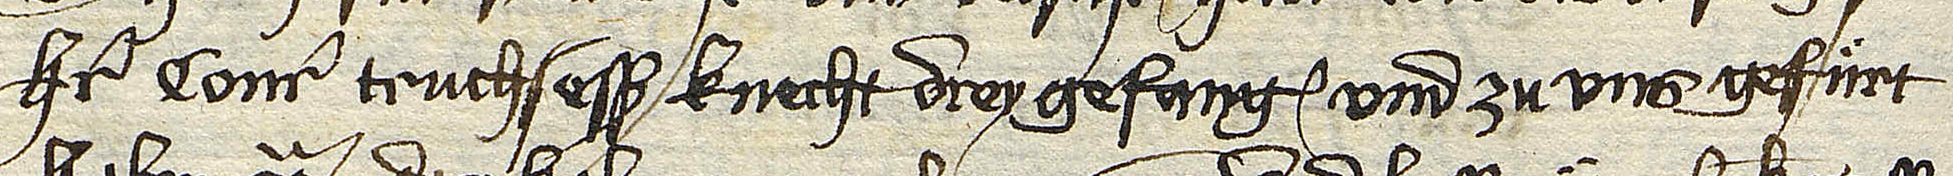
hr* Conr* truchſeſſ* knecht drey gefang* vnd ʒu vns gefürt
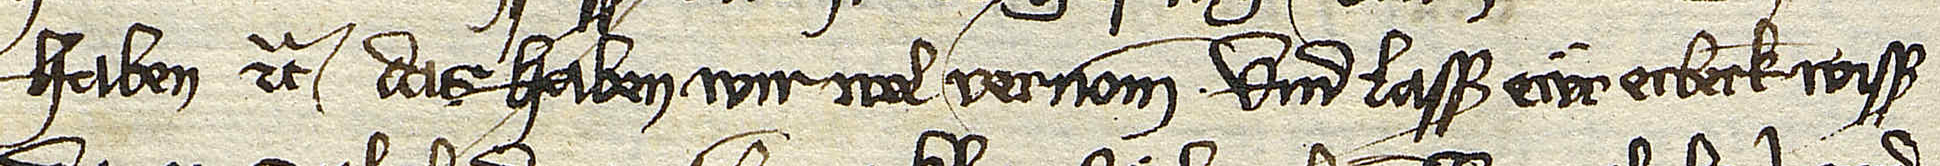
haben ec* das haben wir wol vernom* . Vnd laſſ* ewr erberk* wiſſ*
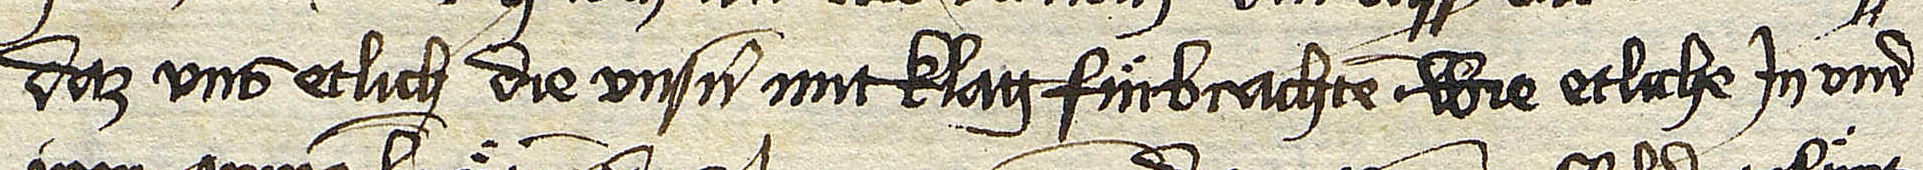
daʒ vns etlich die vnſn* mit klag fürbrachte* wie etliche In vnd
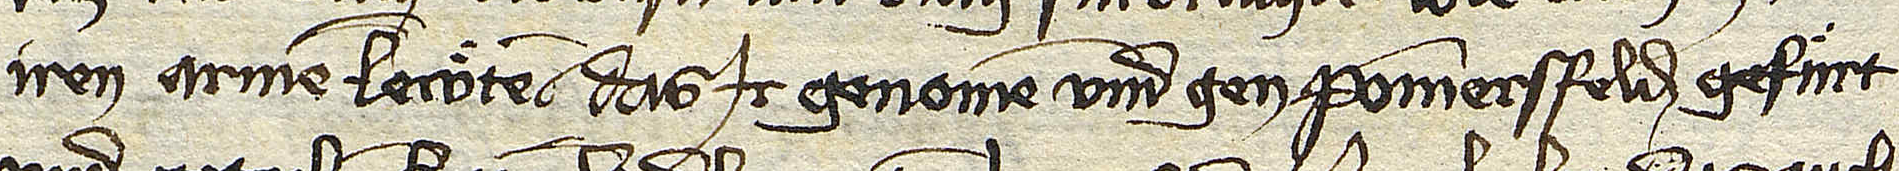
iren arme* lewte* / das Ir genome* vnd gen Pomerſſeld* gefürt
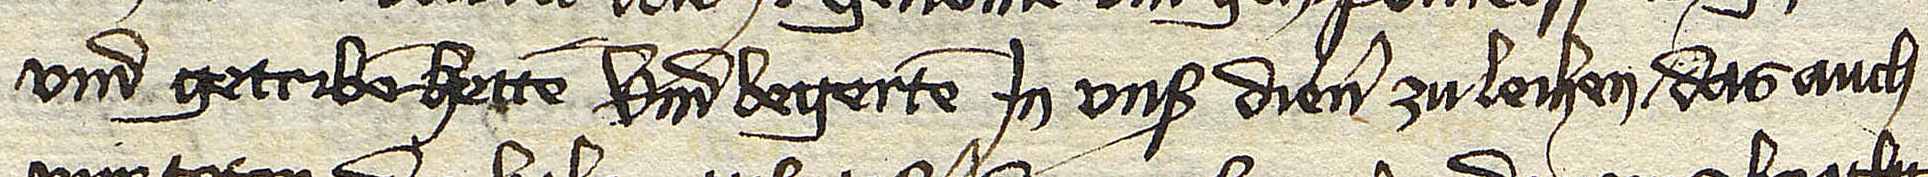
vnd getribe* hette* Vnd begerte* In vnſ* dien* ʒu leihen / das auch
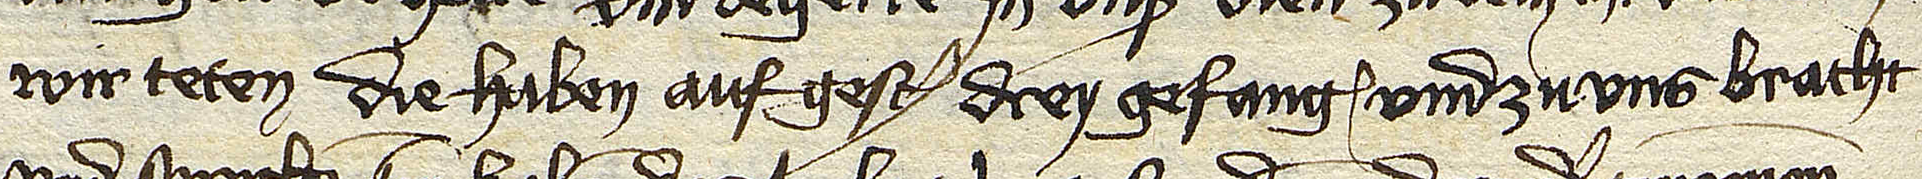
wir teten die haben auf geſt* drey gefang* vnd ʒu vns bracht
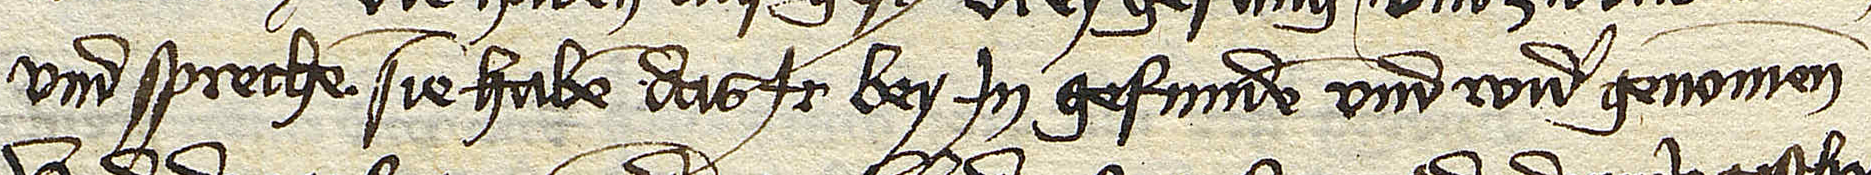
vnd ſpreche* . ſie habe* das Ir bey In gefunde* vnd wid* genomen*
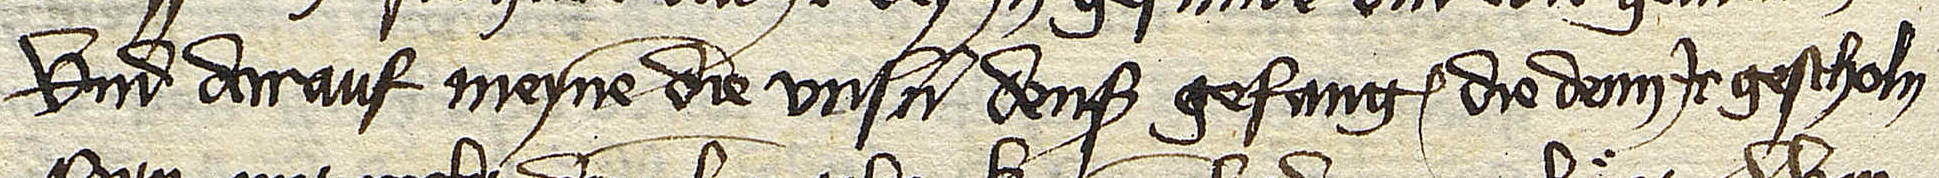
Vnd darauf meyne* die vnſn* denſ* gefang* die denn Ir geſcholn
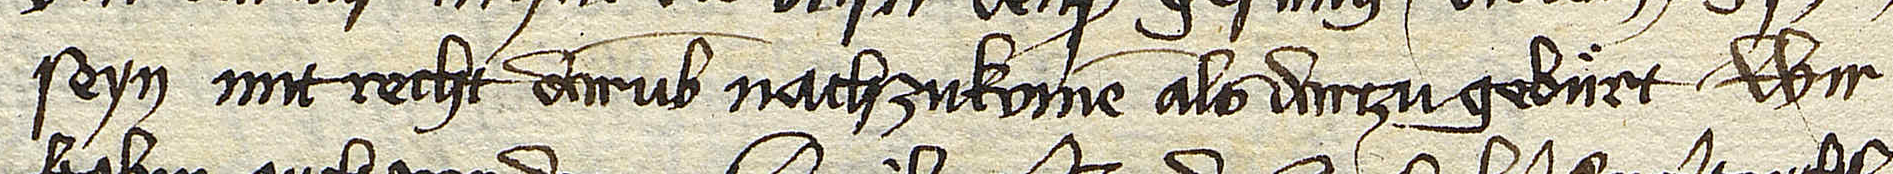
ſeyn mit recht darub* nachʒukome* als darcʒu gebürt / Wir
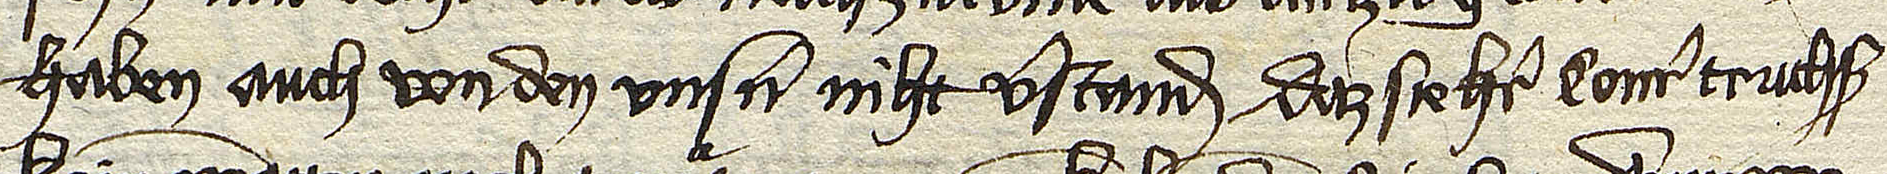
haben auch von den vnſn* niht v*ſtand* / daʒ ſie hr* Conr* truchſ*
